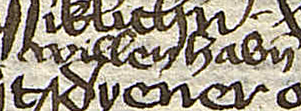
willen habn*
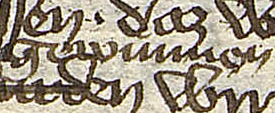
gewunnen
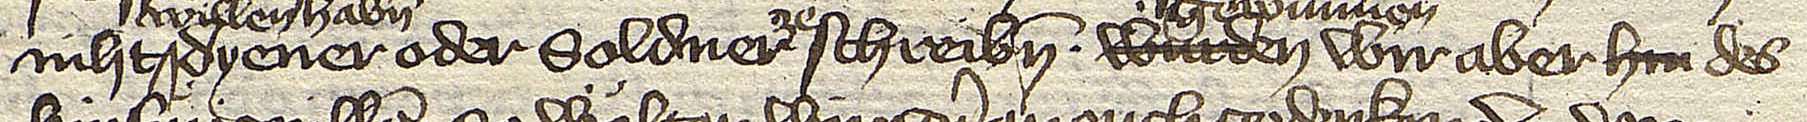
niht dyener oder Soldner ſchreibn* . wurden wir aber hin des
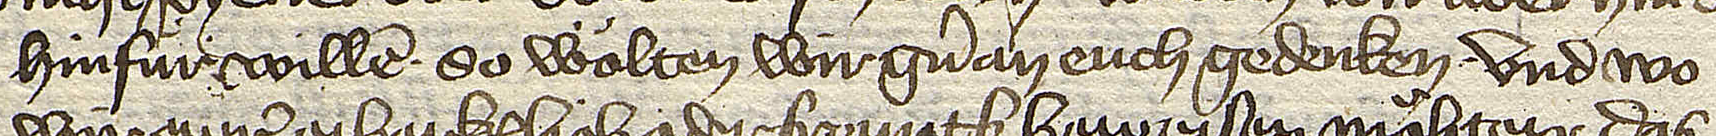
hinfür wille* . So wölten wir gn* an euch gedenken . vnd wo
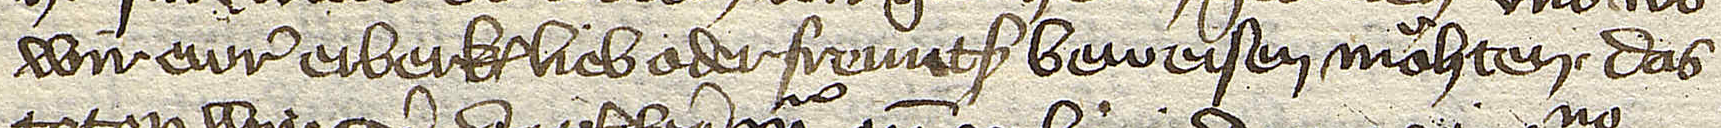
wir ewr* erberk* lieb oder freuntſ* beweiſen möhten / das
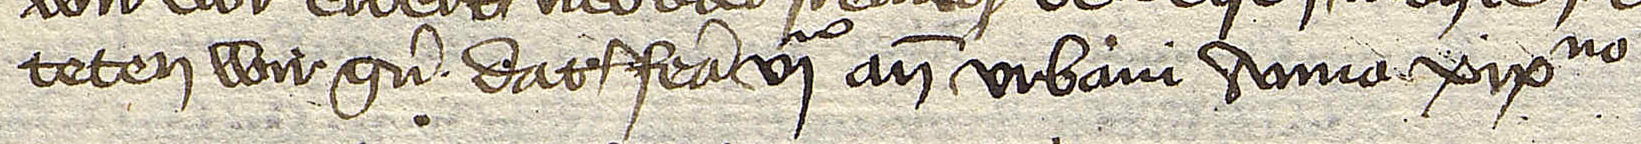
teten wir gn* . dat fea* vi* an* vrbani Anno xix*
